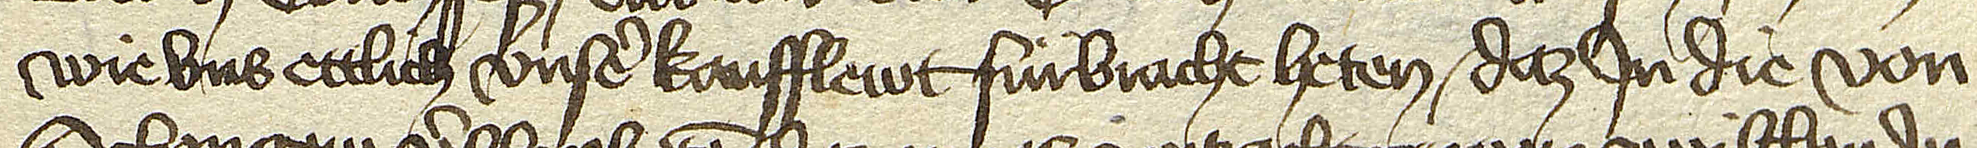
wie vns ettlich vnſe* kaufflewt fürbracht heten / daʒ In die von
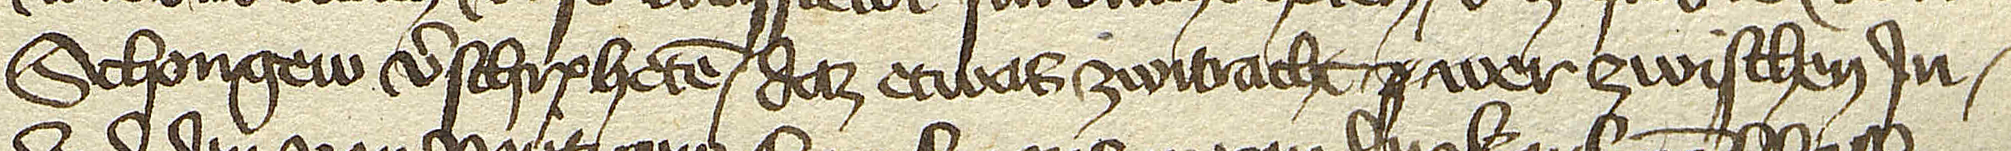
Schongew v*ſchr* hete* / daʒ etwas cʒwitracht cʒ wer cʒwiſchen In /
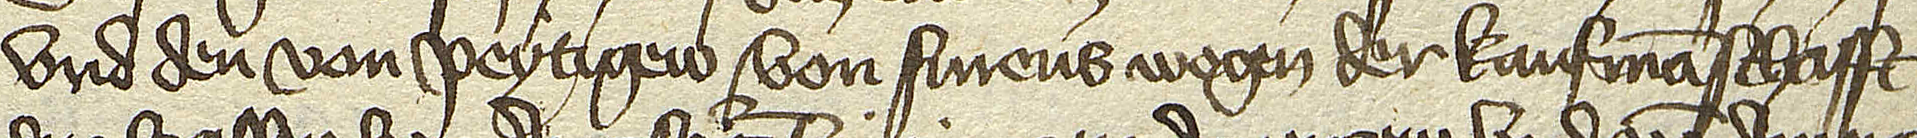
vnd den von Peytigew / von furens wegen der kaufma*ſchafft
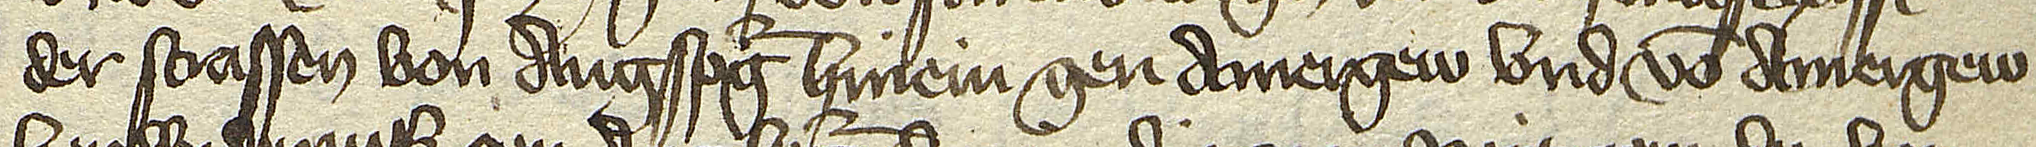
der ſtraſſen von Augſp*g hinein gen Amergew vnd vo* Amergew
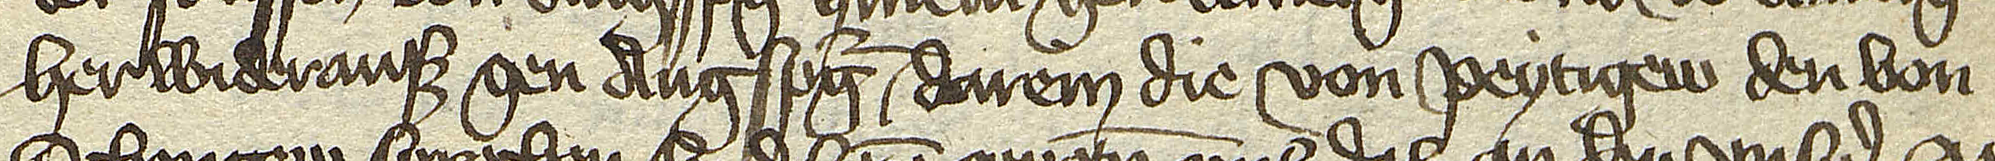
her widerauſʒ gen Augſp*g / darein die von Peytigew den von
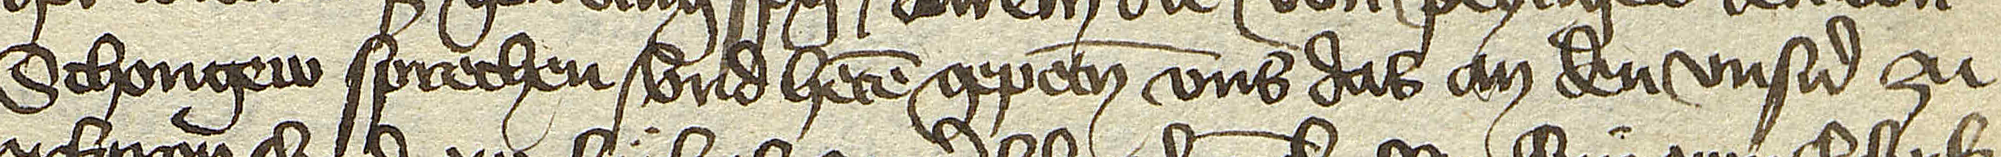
Schongew ſprechen / vnd hete* gepetn* vns das an den vnſn* cʒu
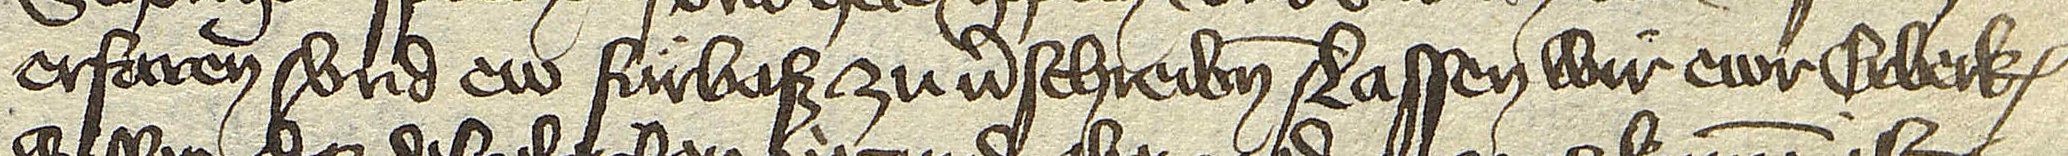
erfaren / vnd ew fürbaſʒ cʒu u*ſchreibn* / Laſſen wir ewr Erberk*
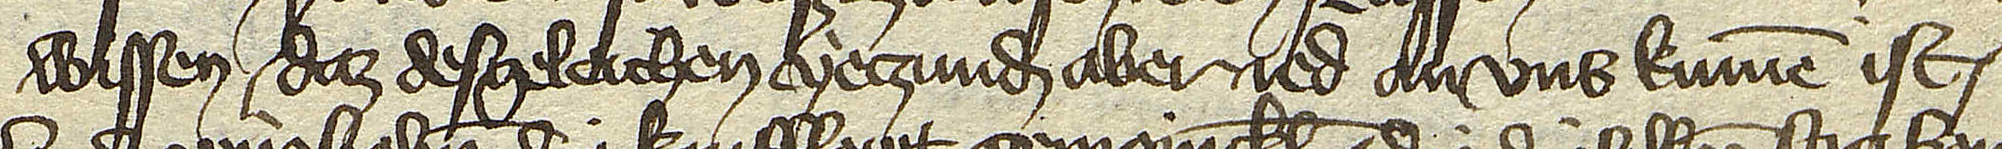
wiſſen / daʒ deſheleichen yecʒund* aber red an vns kume* iſt /
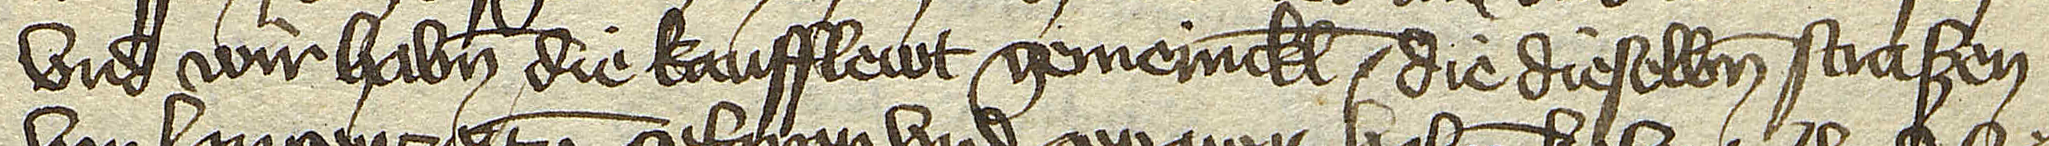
vnd wir habn* die kaufflewt gemeinikl* / die dieſelbn* ſtraſʒen
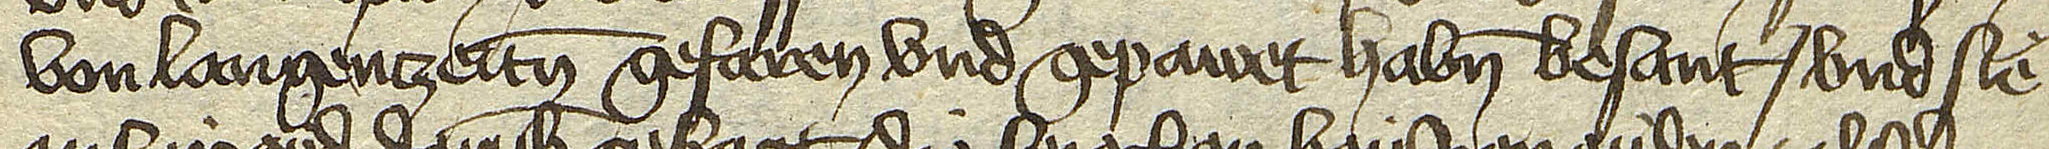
von langencʒeitn* gefaren vnd gepawet habn* beſant / vnd ſie
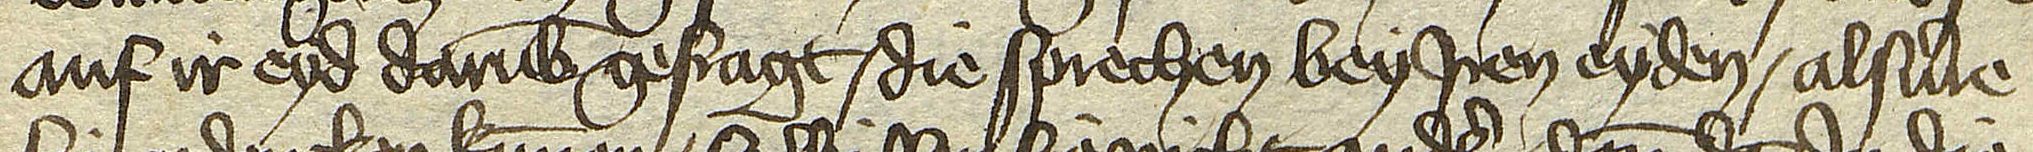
auf ir eyd darub* gefragt / die ſprechen bey Irden eyden / alſu*re
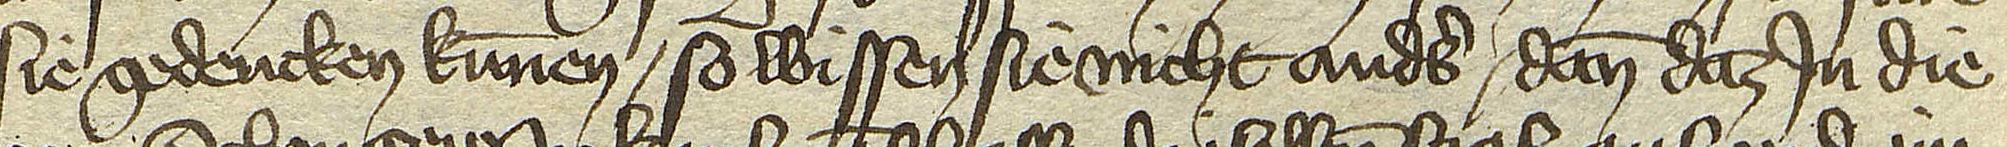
ſie gedencken ku*nen / ſo wiſſen ſie nicht ands* / dan* daʒ In die
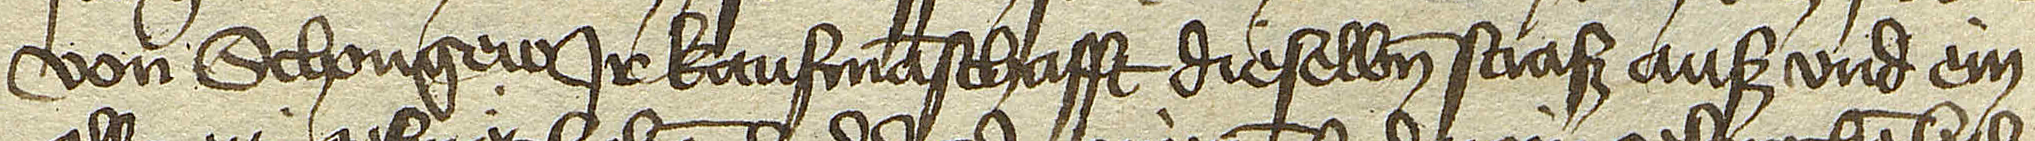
von Schongew Ir kaufma*ſchafft dieſelbn* ſtraſʒ auſʒ vnd ein
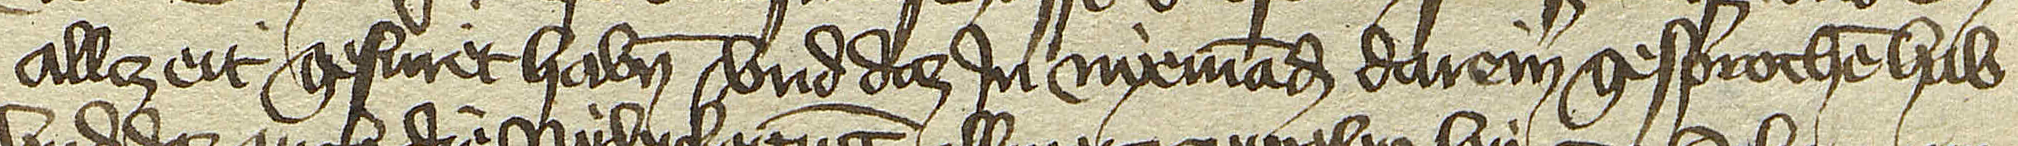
allcʒeit gefüret habn* / vnd daʒ In nyemad* darein geſproche* hab
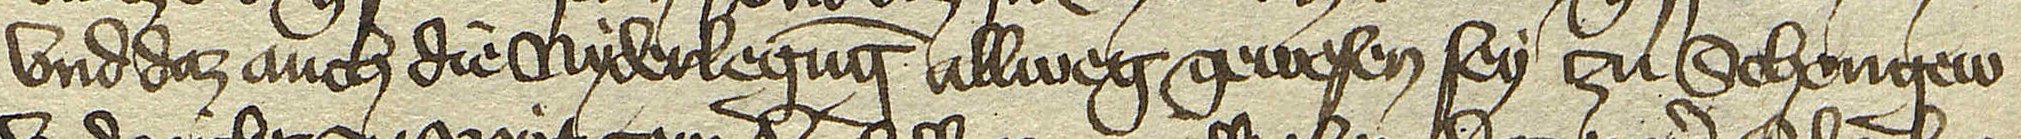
vnd daʒ auch die Nyderlegug* allweg geweſen ſey cʒu Schongew
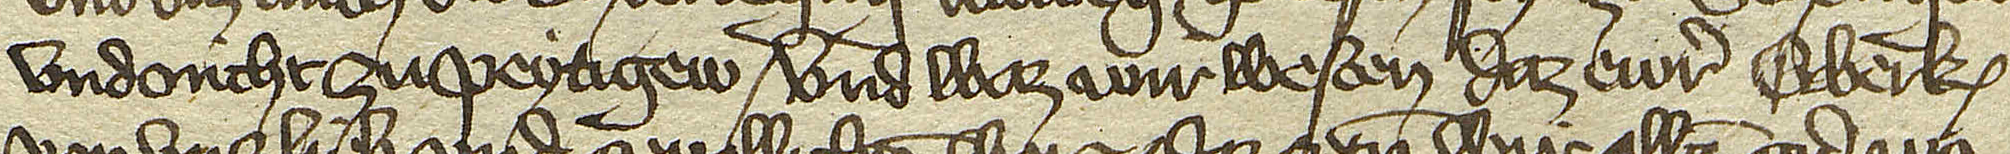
vnd nicht cʒu Peytigew / vnd waʒ wir weſten daʒ ewr* Erberk*
